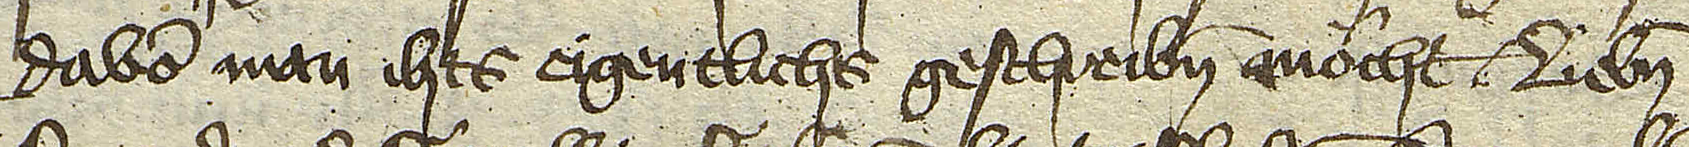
davo* man ihts eigentlichs geſchreibn* möcht / Liebn*
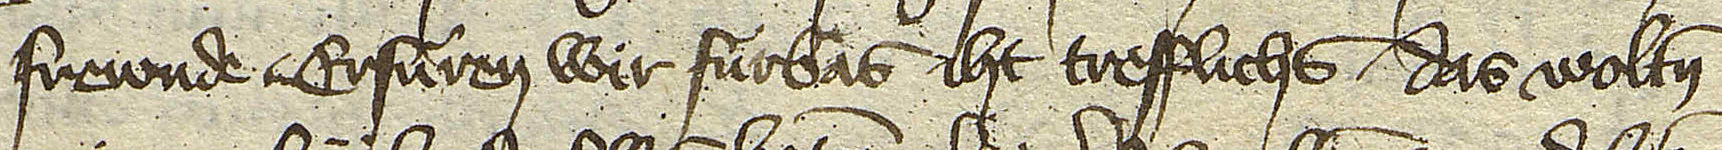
frewnde / Erfüren wir fürbas iht trefflichs / das woltn*
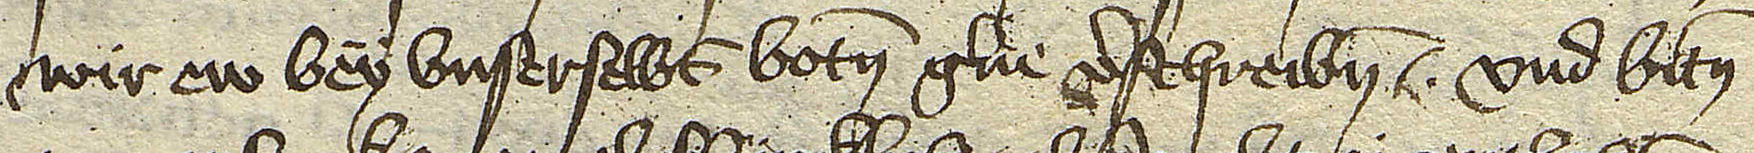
wir ew bey vnſerſelbs botn* g*ne v*ſchreibn* / . vnd bitn*
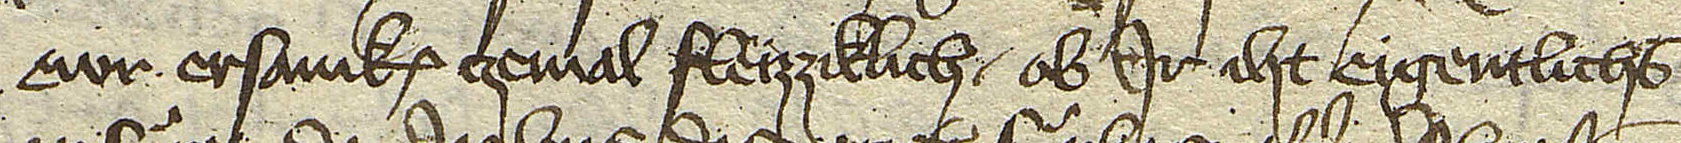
ewr erſamk* cʒemal fleiʒʒiklich / ob Ir iht eigentlichs
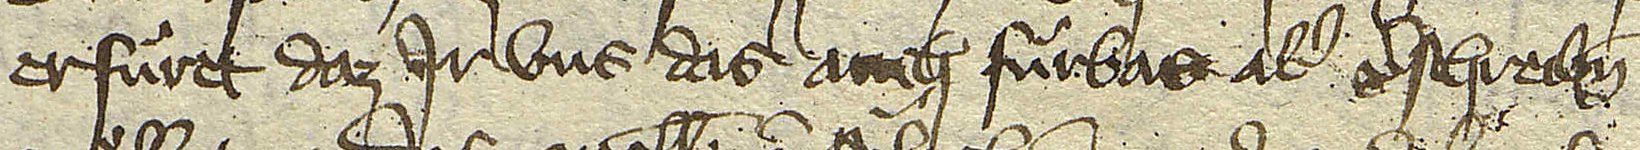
erfüret daʒ Ir vns das auch fürbas ab* v*ſchreibn*
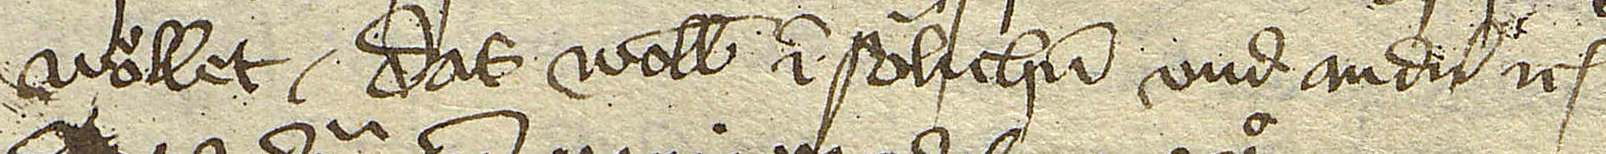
wöllet / Das woll* i* ſölichn* vnd andn* ec*
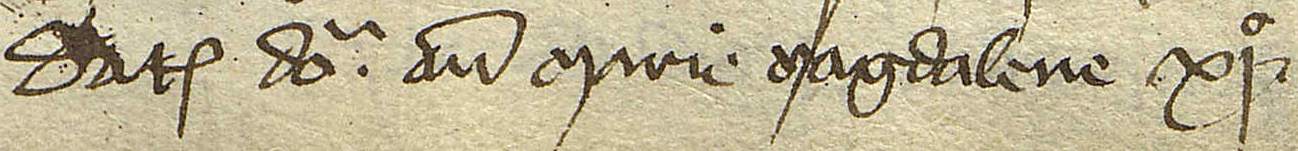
Dat* do* . an* Marie Magdalene xi*.
